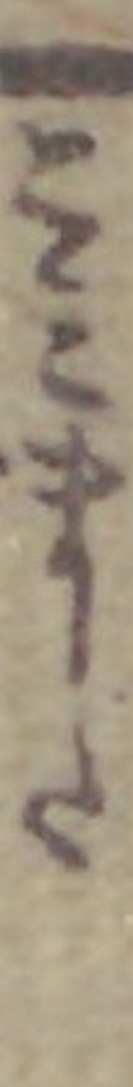こみました
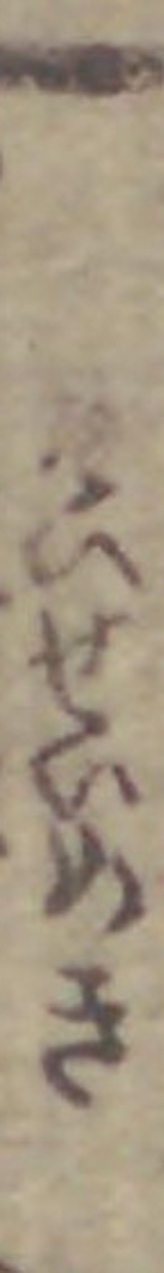けいせいめき
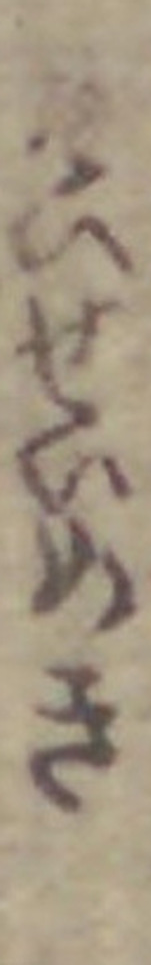けいせいめき
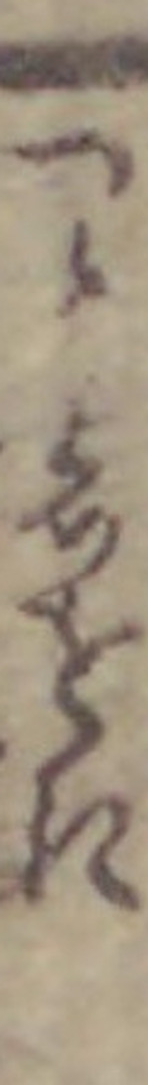つとしをき
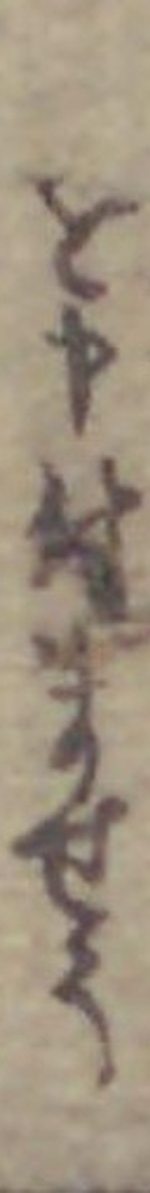を申付ませう
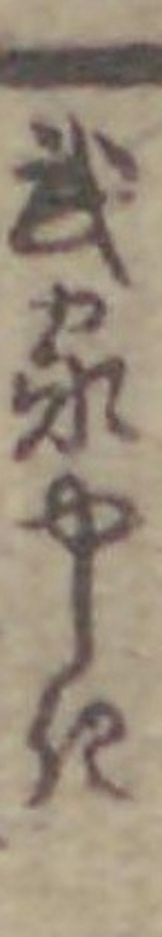武家やしき
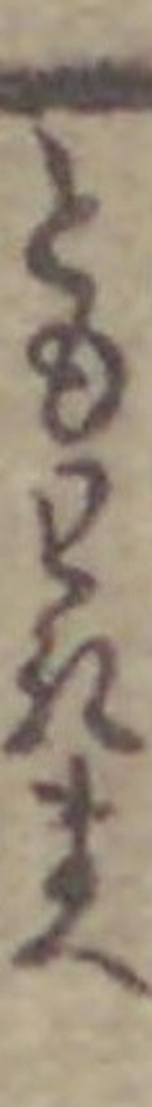ともわきまへ
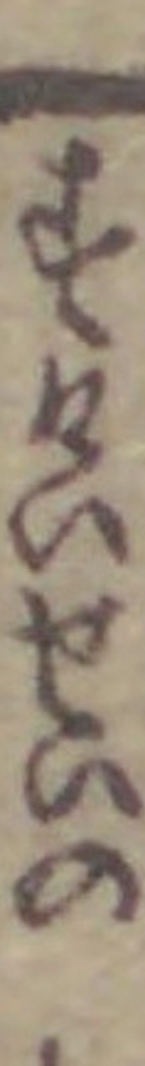すけいせいの
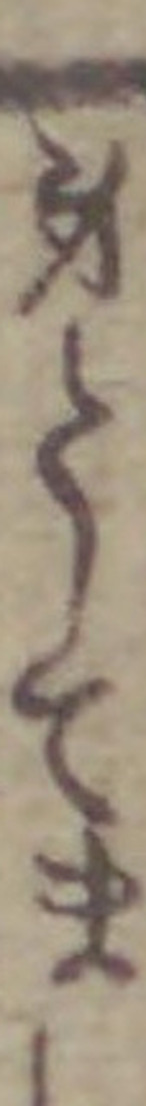身としてま
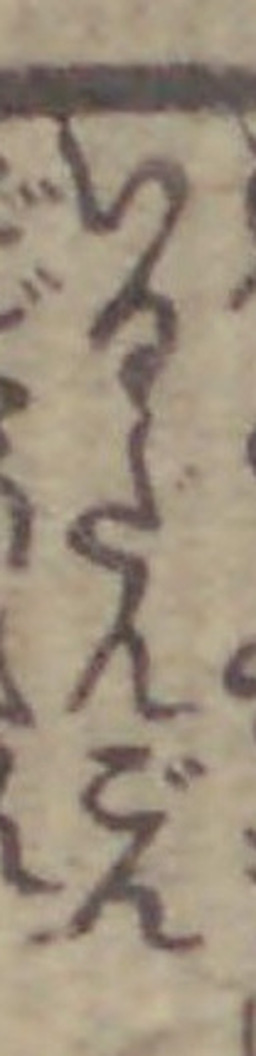いるだんごん
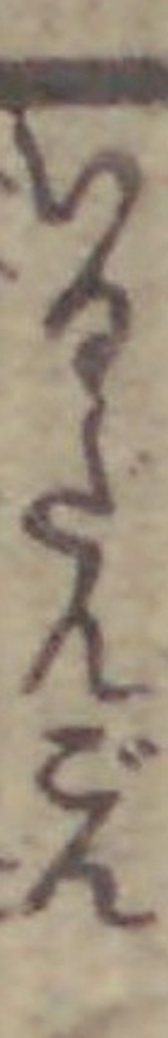いるだんごん
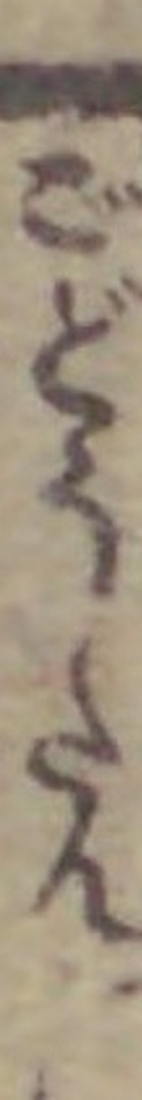ごどうたん
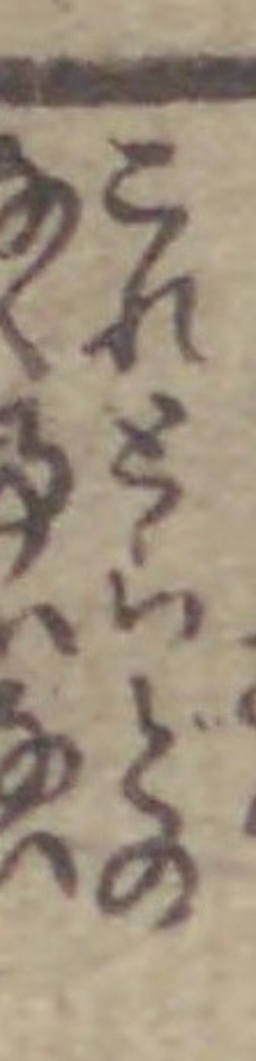なく事はない
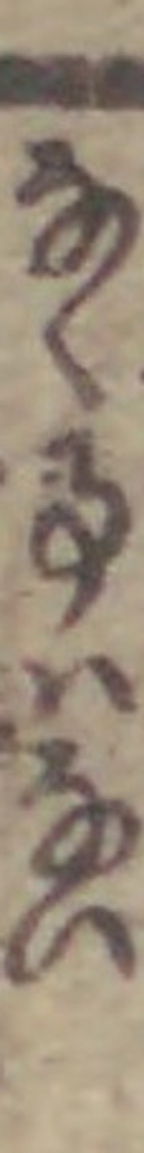なく事はない
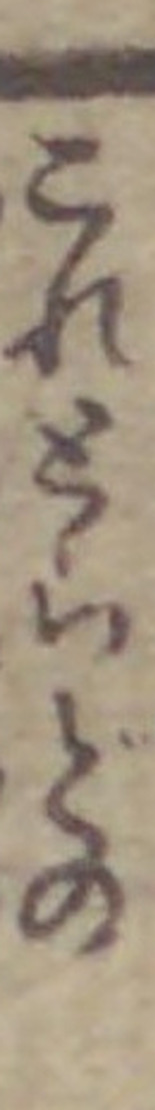これとらどの
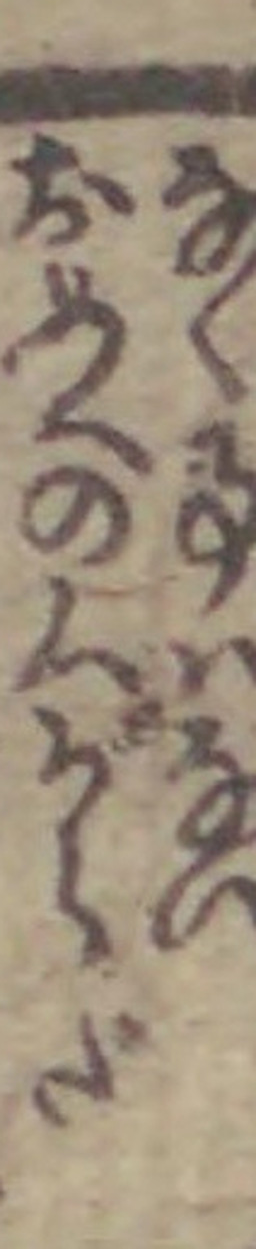おめへの人がらだ
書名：間似合嘘言曽我 3巻
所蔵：国立国会図書館 National Diet Library, JAPAN
